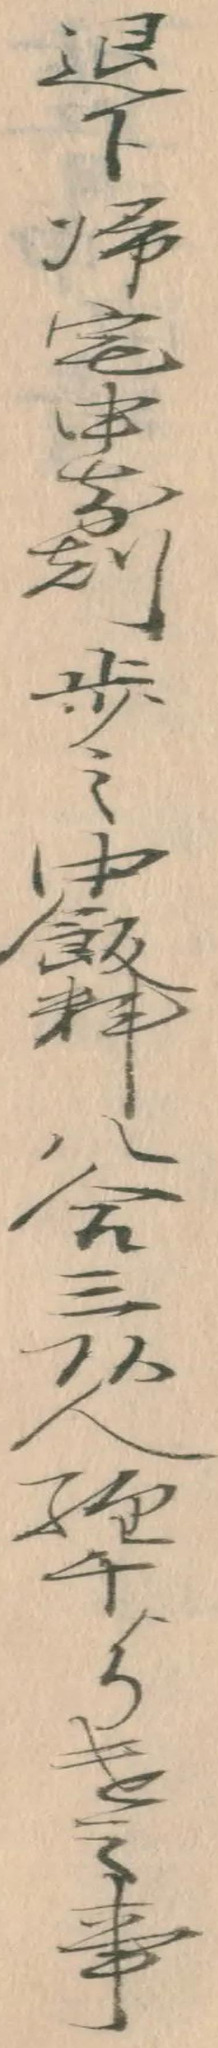退下帰宅申前刻歩之中飯料八合三頭人経千より遣之事
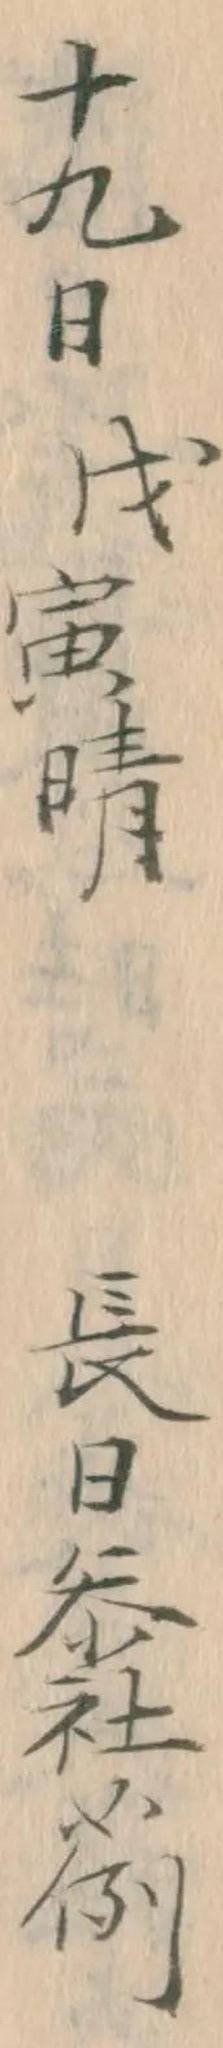十九日戊寅晴長日参社如例
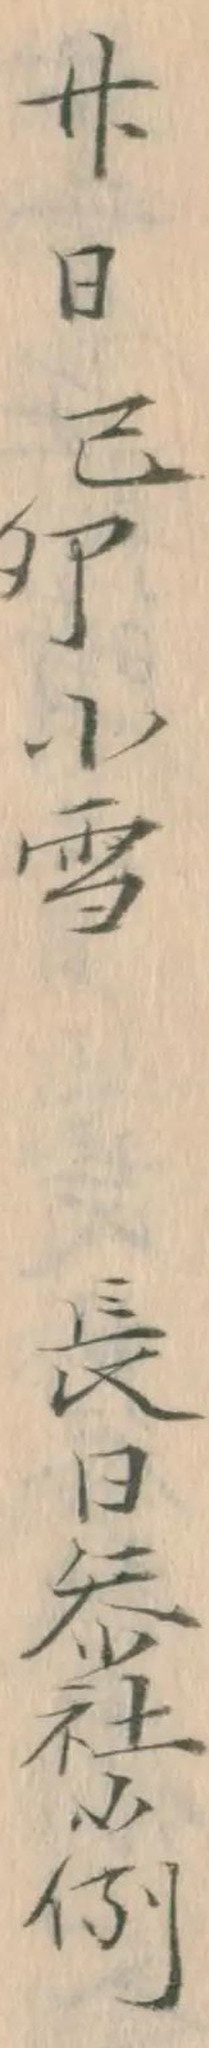廿日己卯小雪長日参社如例
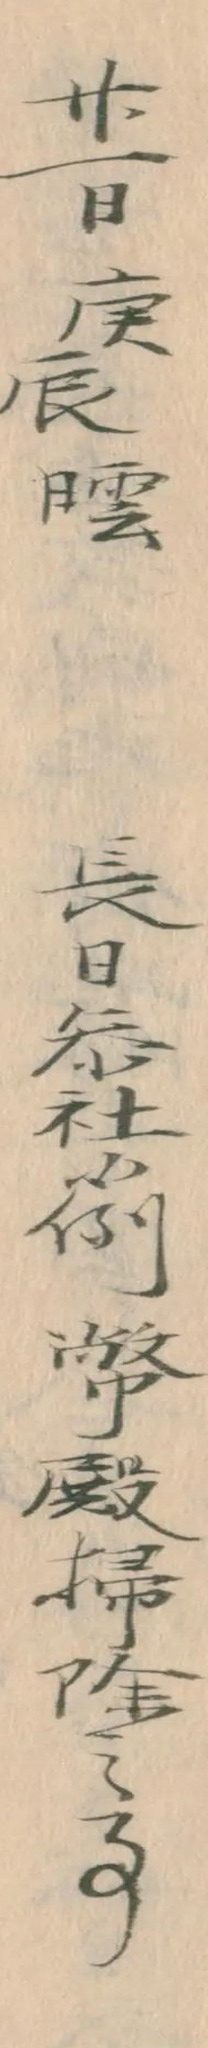廿一日庚辰曇長日参社如例幣殿掃除之事
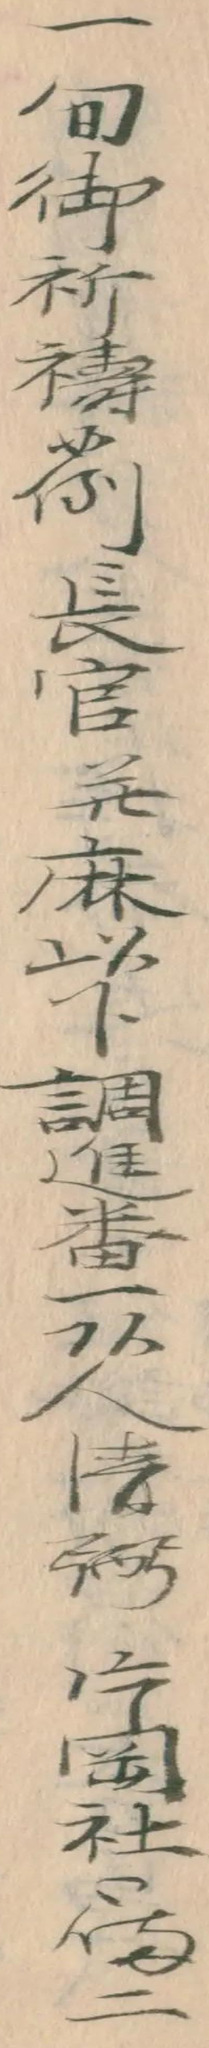一旬御祈祷如例長官并麻以下調進番一頭人清弼片岡社御備二
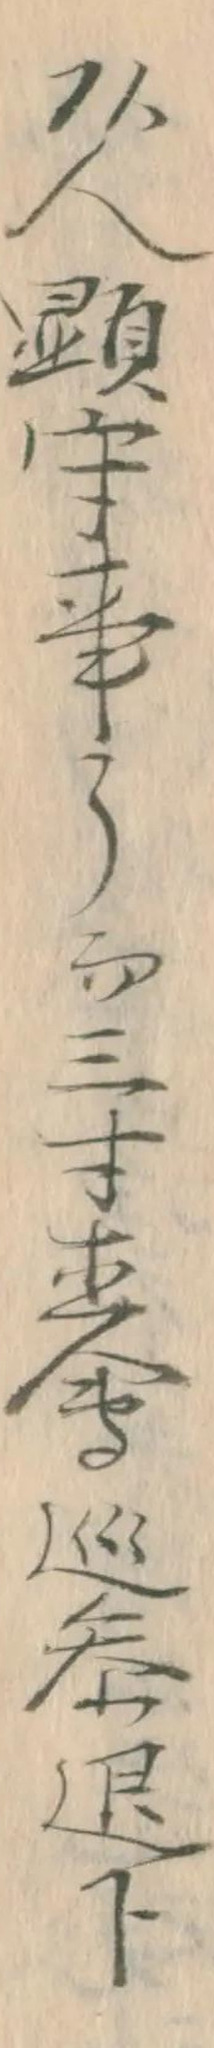頭人顕守事了而三寸直會巡参退下
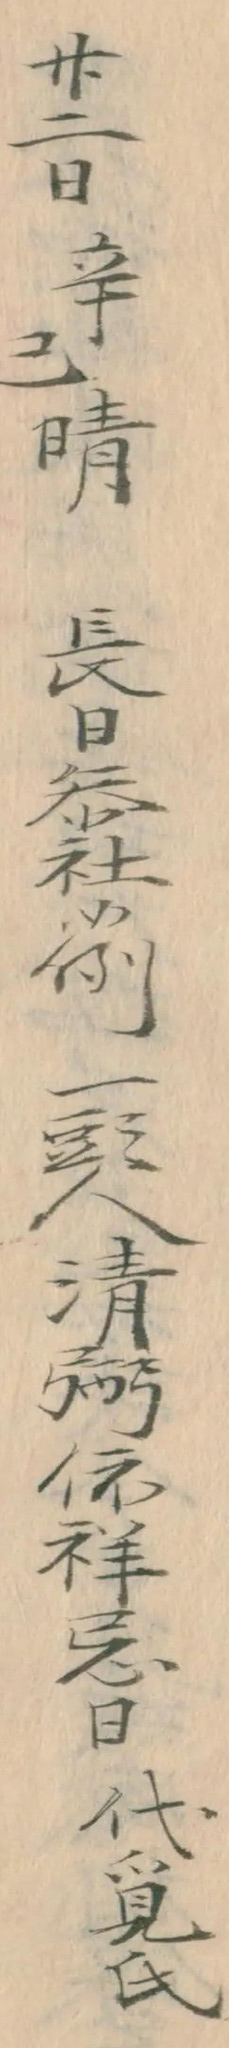廿二日辛巳晴長日参社如例一頭人清弼依祥忌日代覓氏

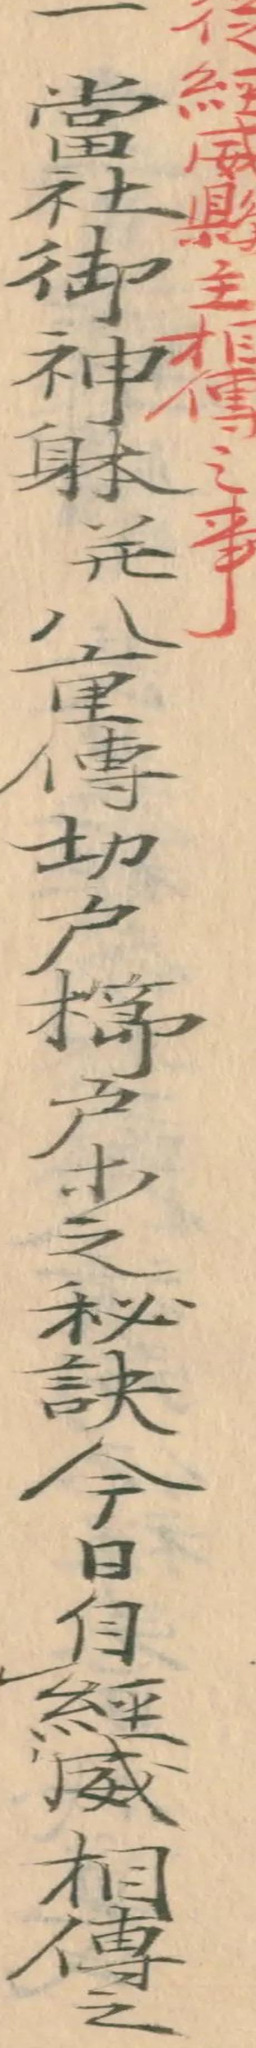一當社御神躰并八重傳切戸櫛戸等之秘訣今日自経威相傳之
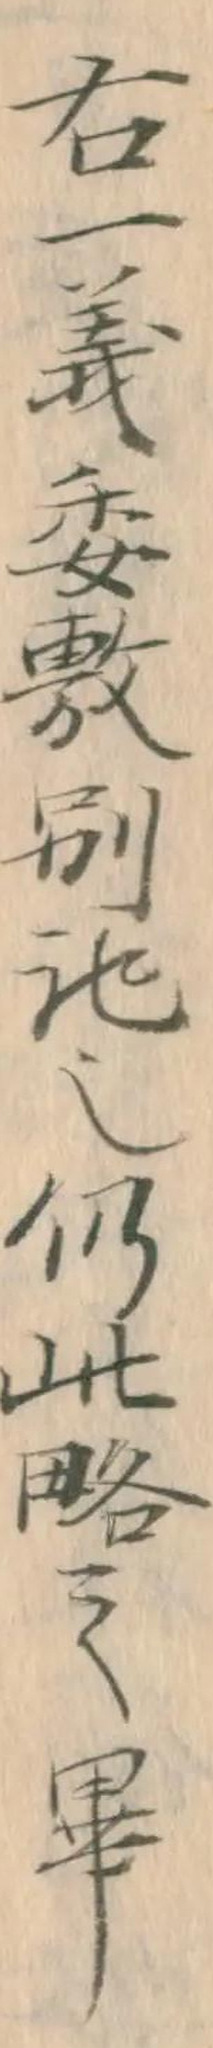右一義委敷別記也仍此略之畢
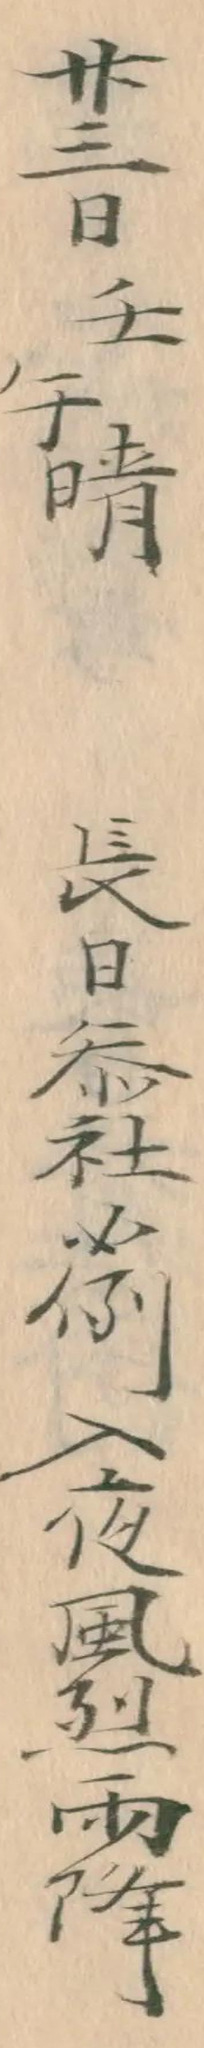廿三日壬子晴長日参社如例入夜風烈雨降
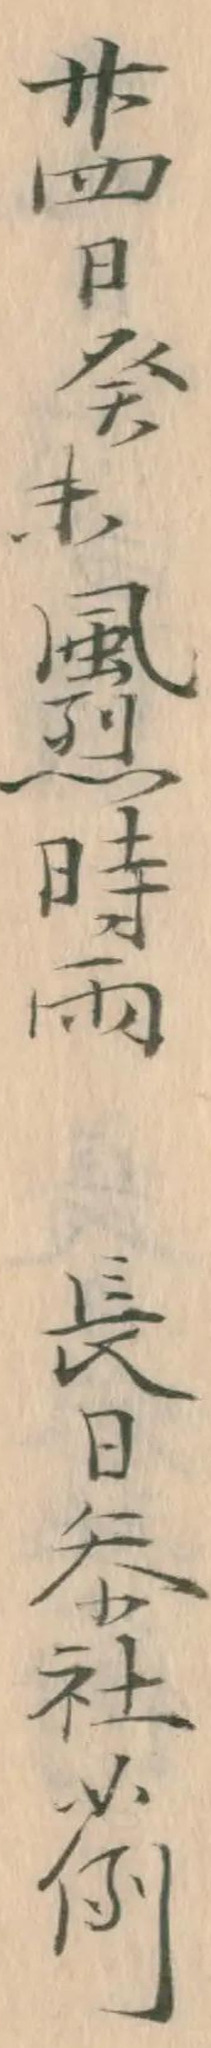廿四日癸未風烈時雨長日参社如例
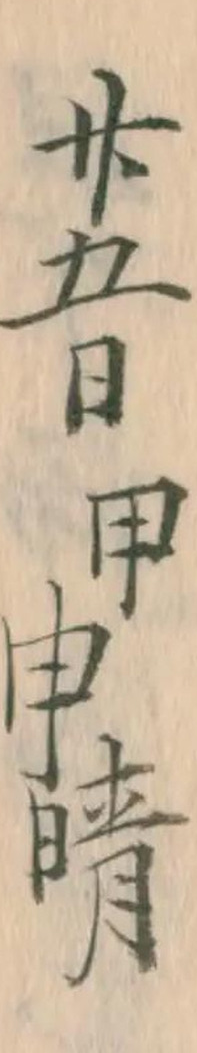廿五日甲申晴
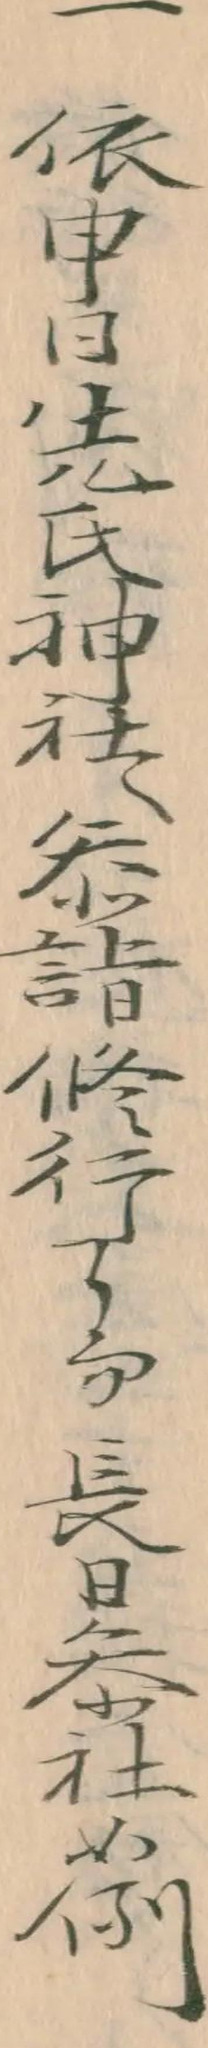一依申日先氏神社へ参詣修行了而長日参社如例
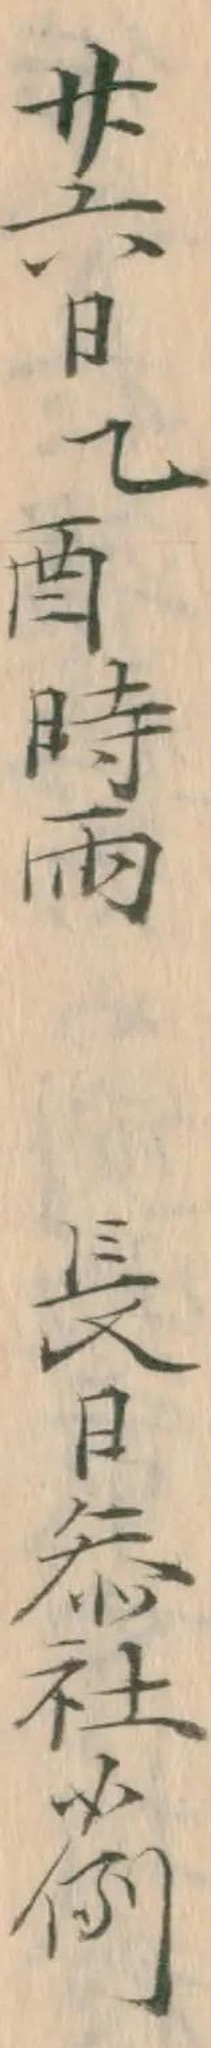廿六日乙酉時雨長日参社如例
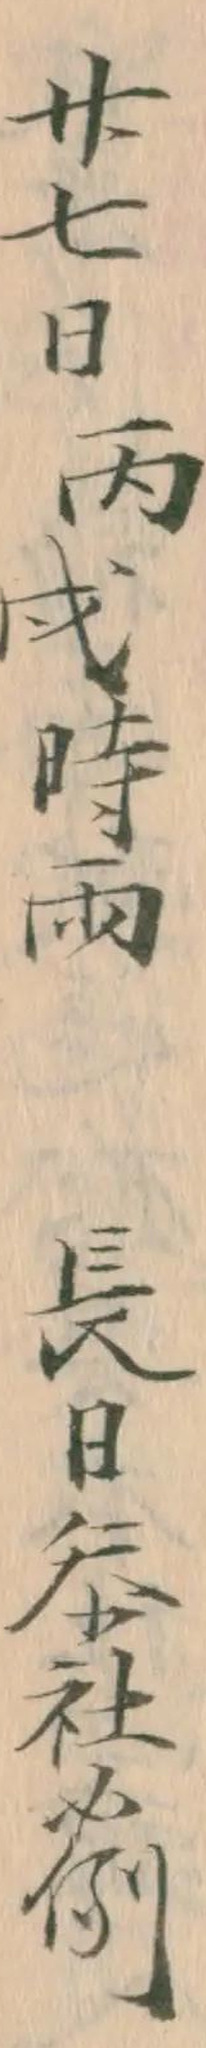廿七日丙戌時雨長日参社如例
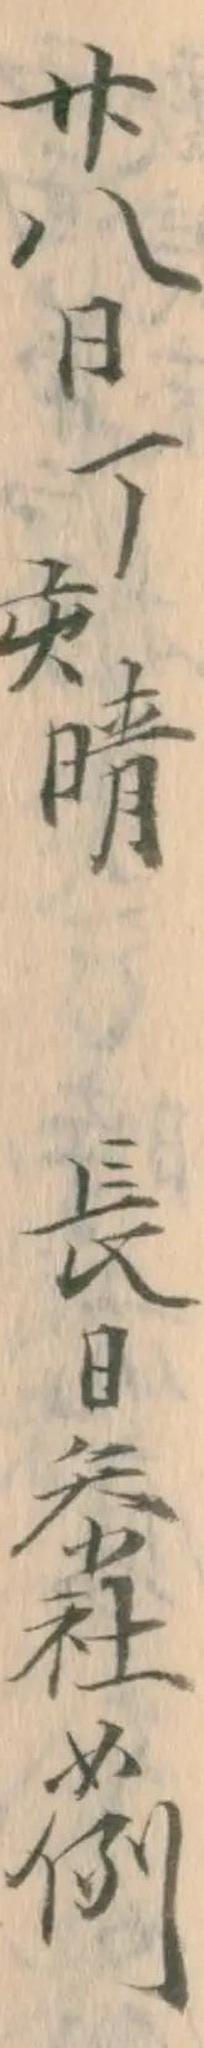廿八日丁亥晴長日参社如例
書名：賀茂社記録. 第74冊
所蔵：国立国会図書館 National Diet Library, JAPAN
